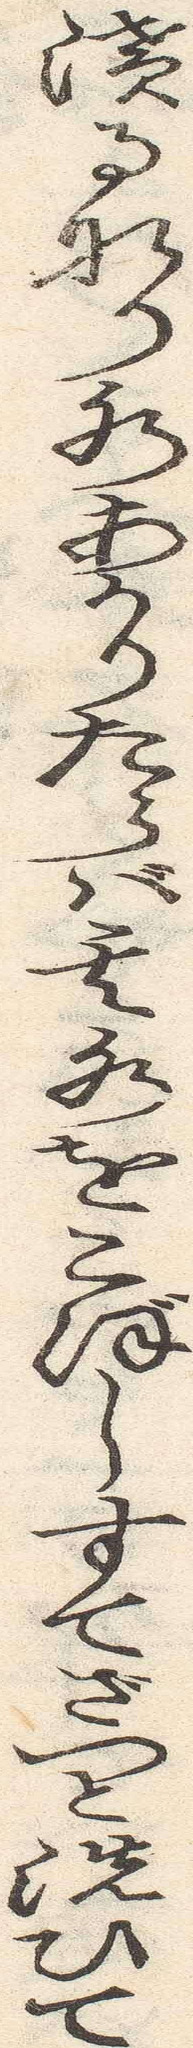漬るなり水あかりたらば其水をこぼしすてざつと洗ひて
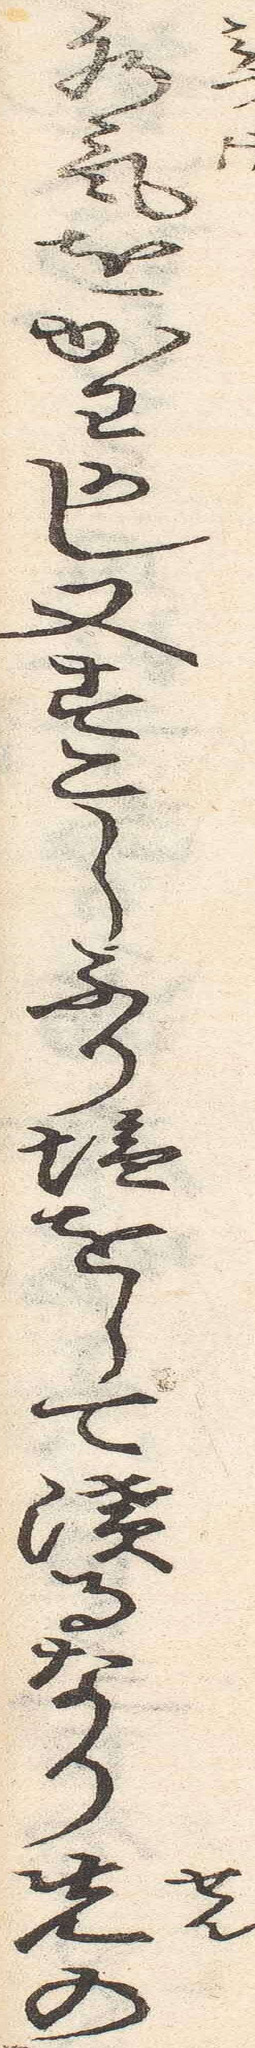水気をかわかし又すこしふり塩をして漬るなり先の
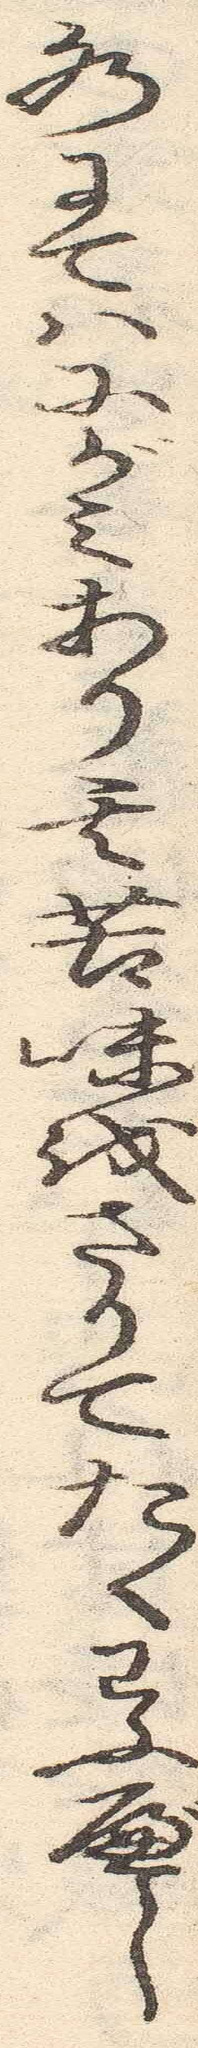水にてはにがみあり其苦味をさりてたくわふべし
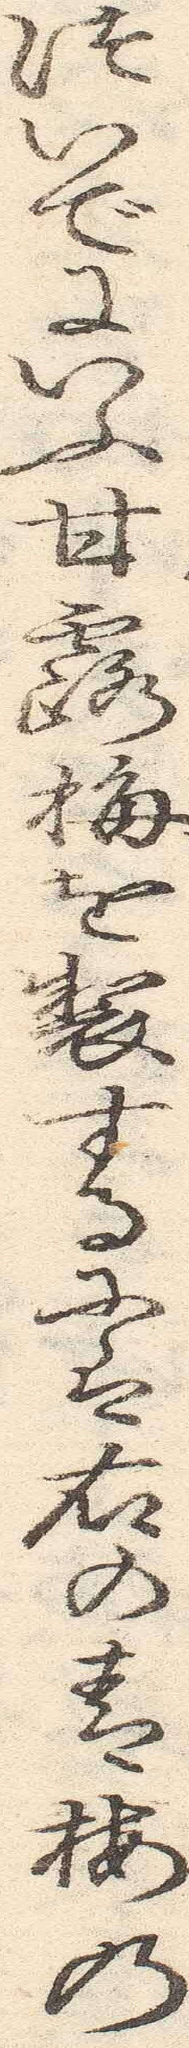ついでにいふ甘露梅を製するには右の青梅の
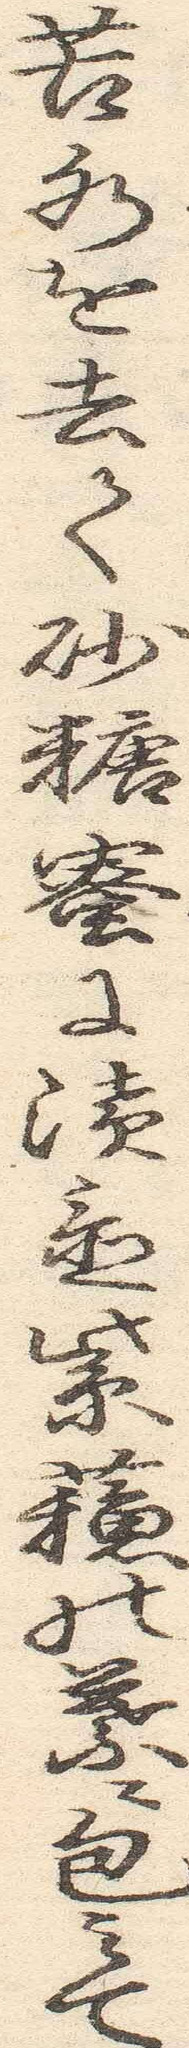苦水を去て砂糖蜜に漬置紫蘇の葉に包みて
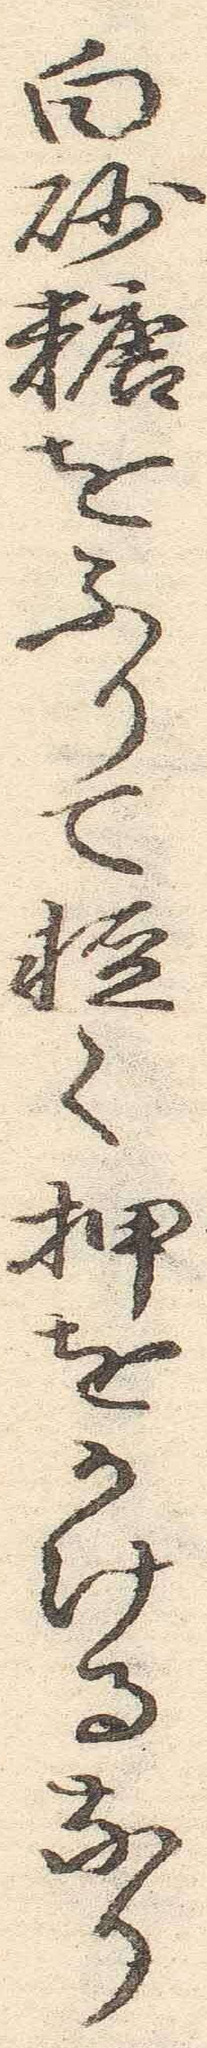白砂糖をふりて軽く押をかけるなり
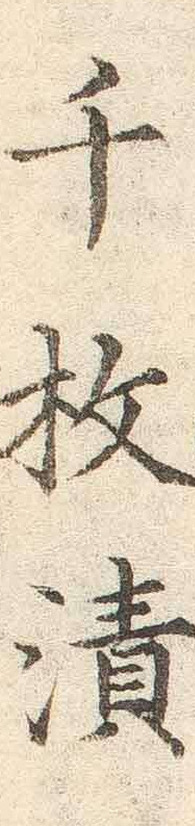千枚漬
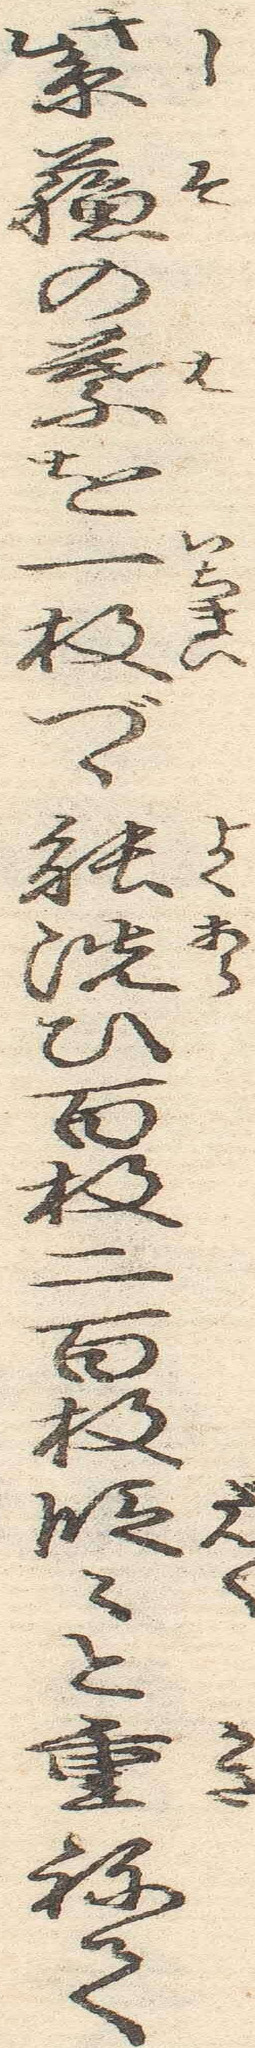紫蘇の葉を一枚づゝ能洗ひ百枚二百枚段々と重ねて
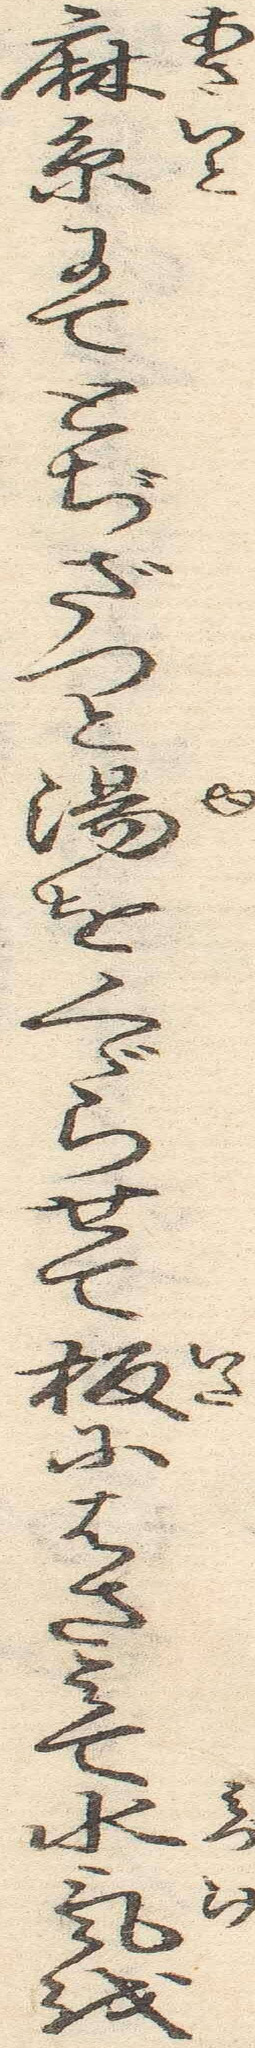麻糸にてとぢざつと湯をくゞらせて板にはさみて水気を
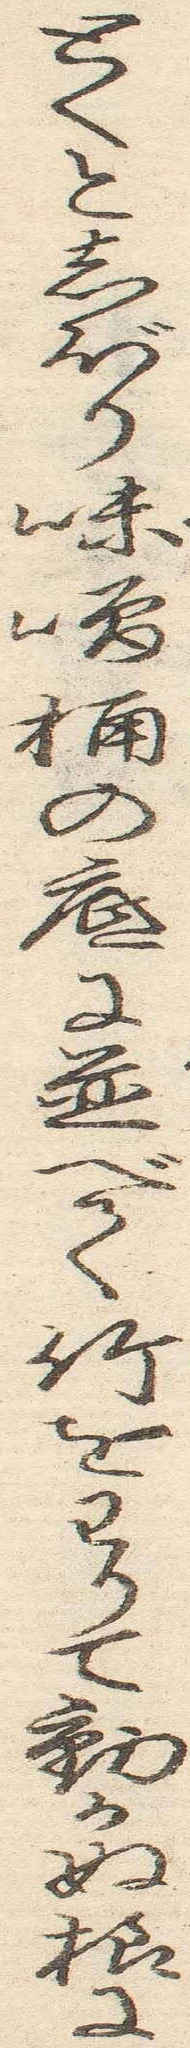とくとしぼり味噌桶の底に並べて竹をわりて動かぬ様に
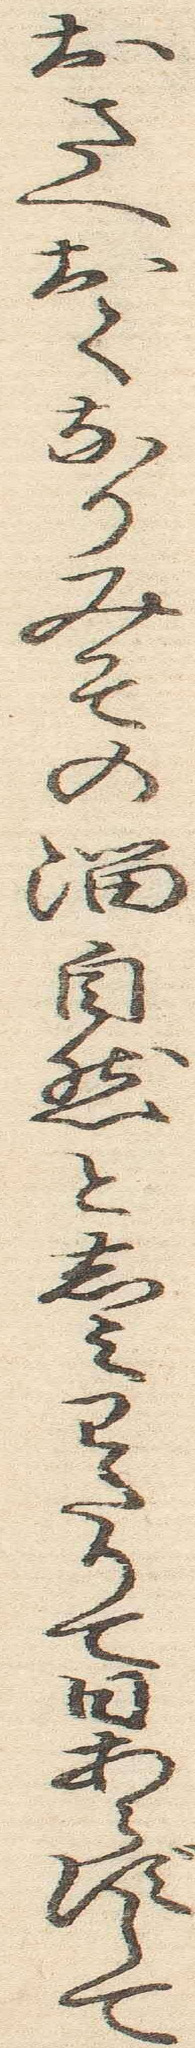おさへおくなりみその溜自然としみわたりて日あらずして

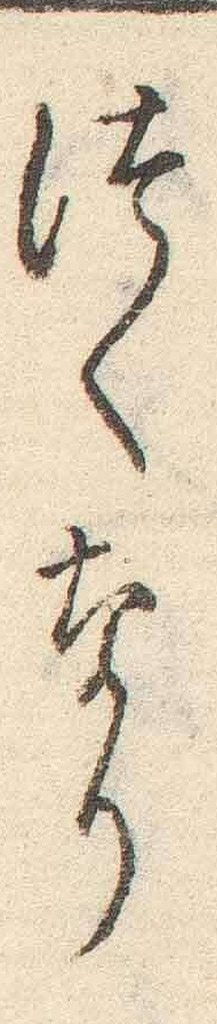つくなり
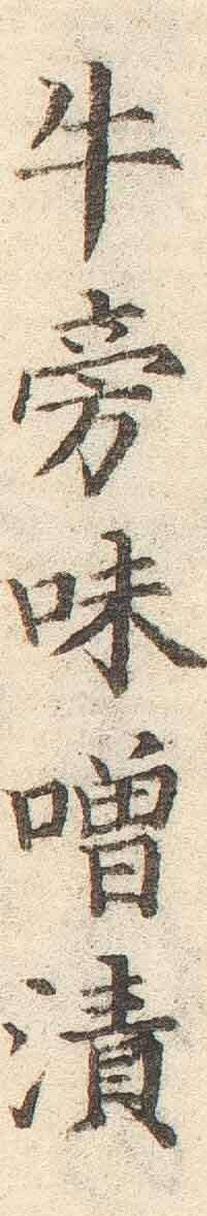牛蒡味噌漬
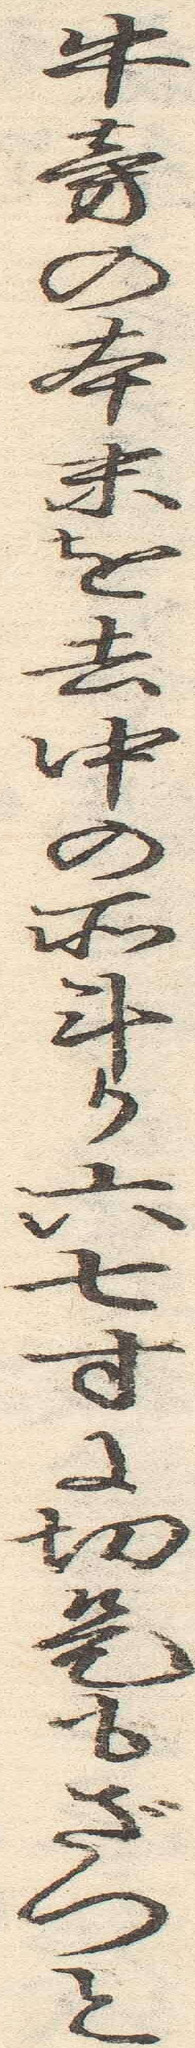牛蒡の本末を去中の所斗り六七寸に切是もざつと
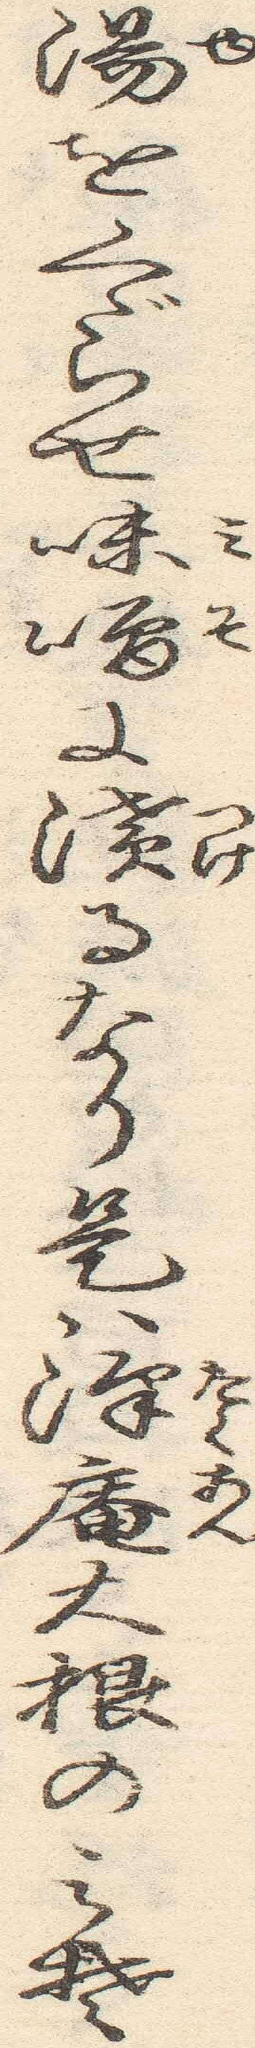湯をくゞらせ味噌に漬るなり是は沢庵大根のみそ
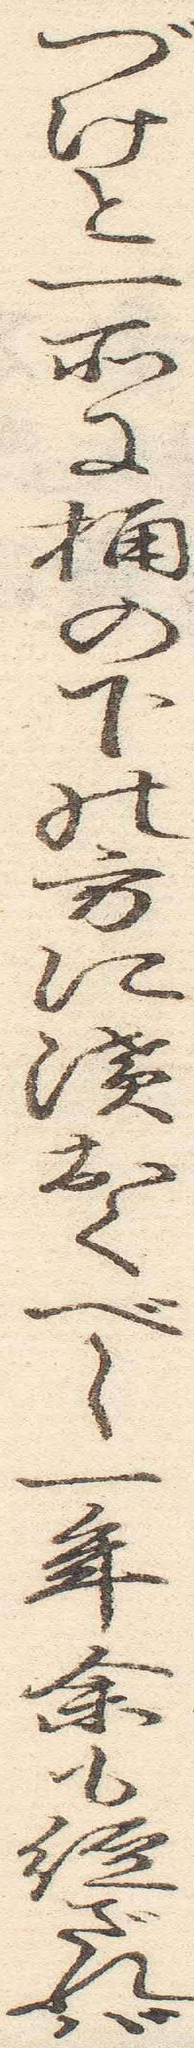づけと一所に桶の下の方に漬おくべし一年余も経ざれば
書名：四季漬物塩嘉言
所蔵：東京学芸大学附属図書館 国文学研究資料館
